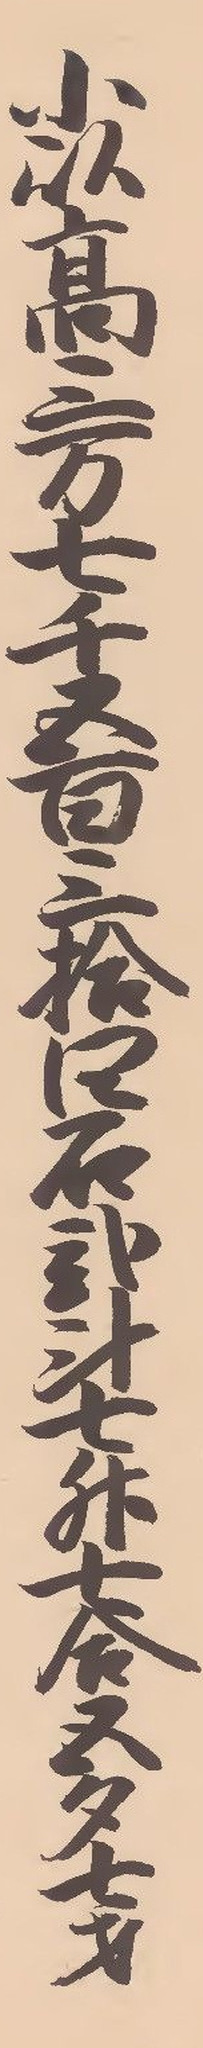小以高三万七千五百三拾四石弐斗七升七合五勺七才
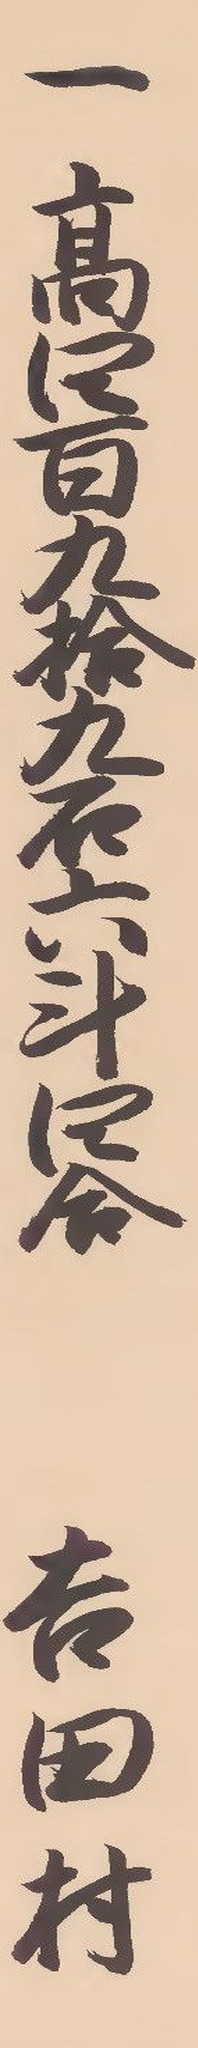一高四百九拾九石六斗四合吉田村
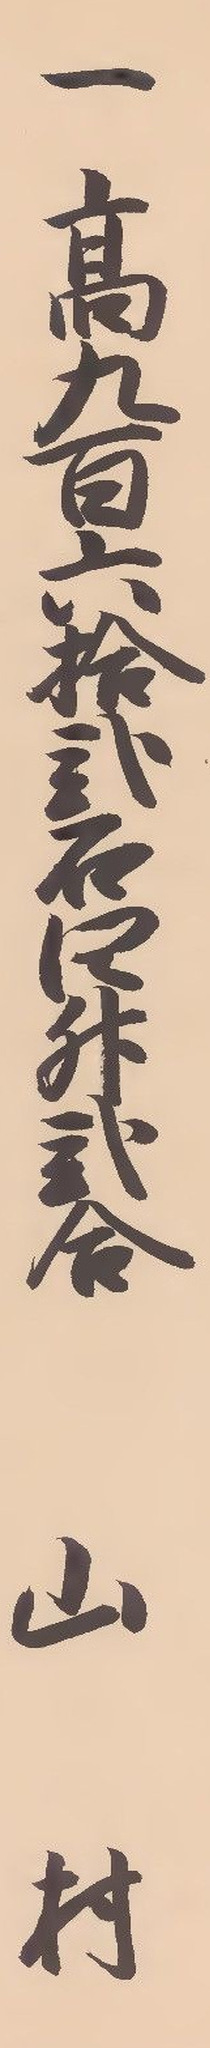一高九百六拾弐石四升弐合山村
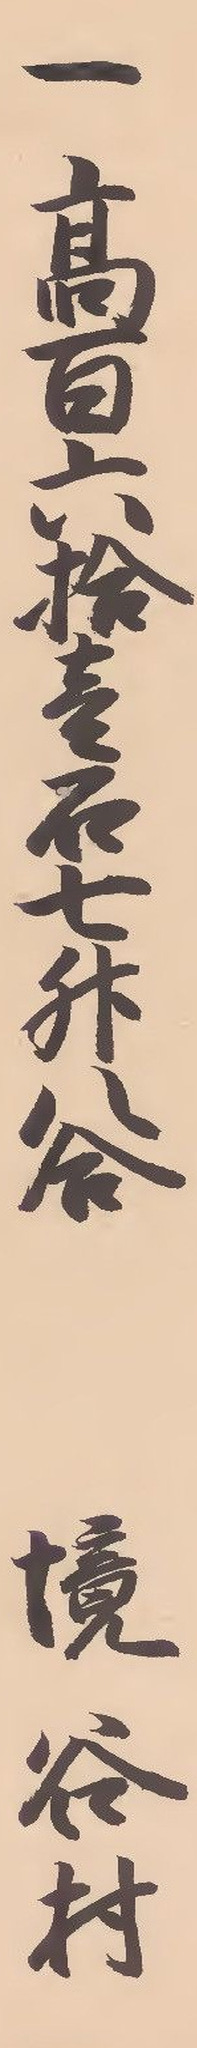一高百六拾壱石七升八合境谷村

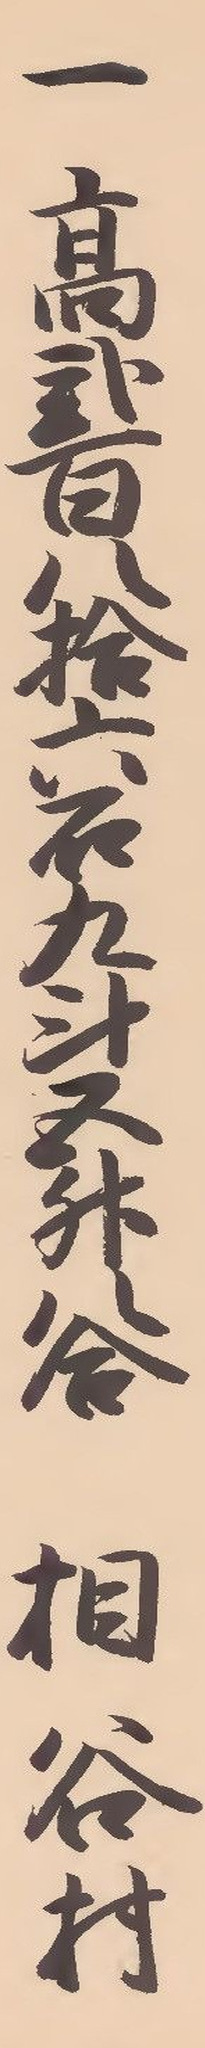一高弐百八拾六石九斗五升八合相谷村
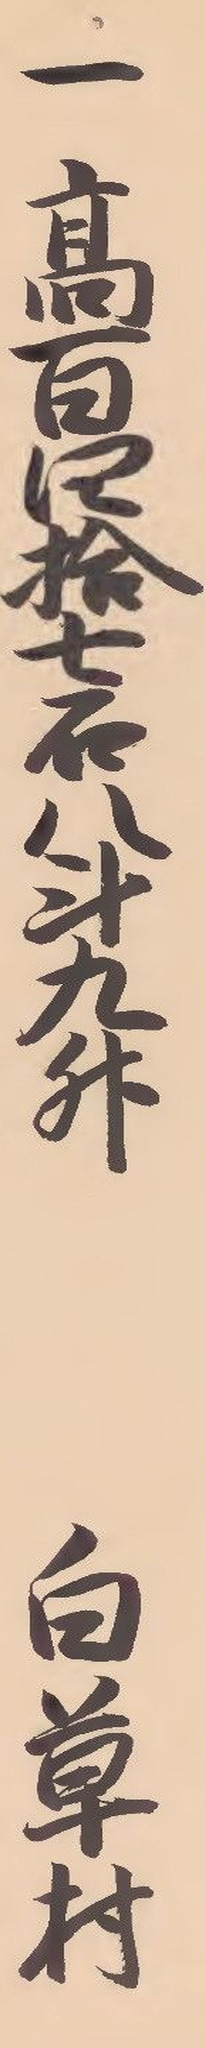一高百四拾七石八斗九升白草村
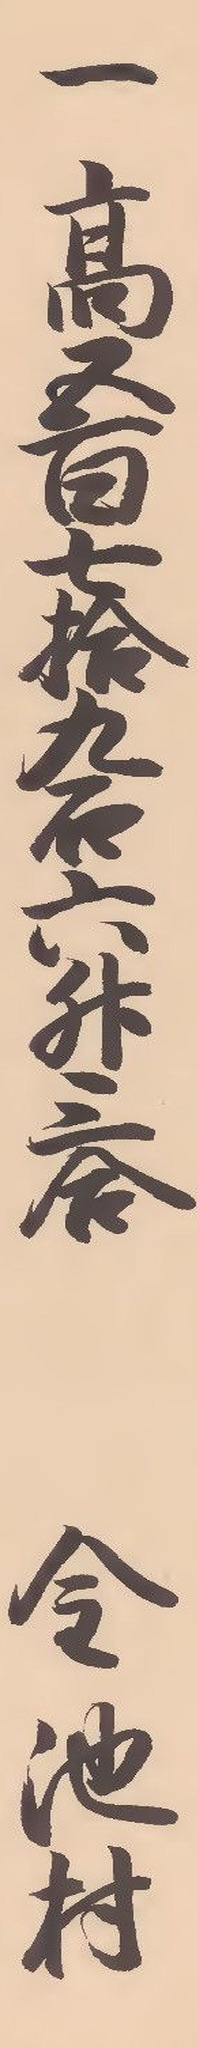一高五百七拾九石六升三合金池村
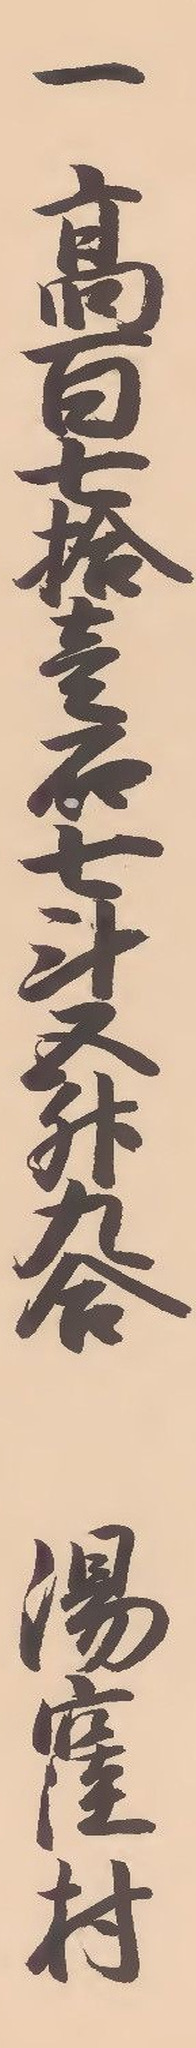一高百七拾壱石七斗五升九合湯窪村

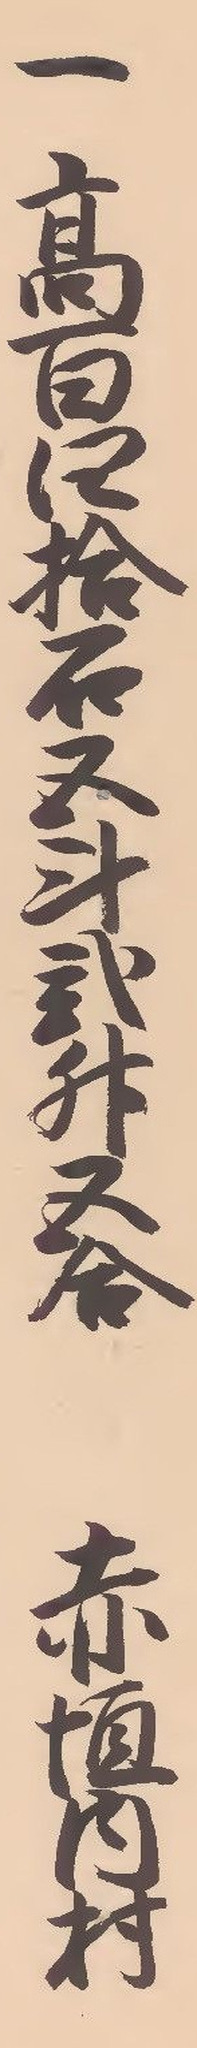一高百四拾石五斗弐升五合赤垣内村
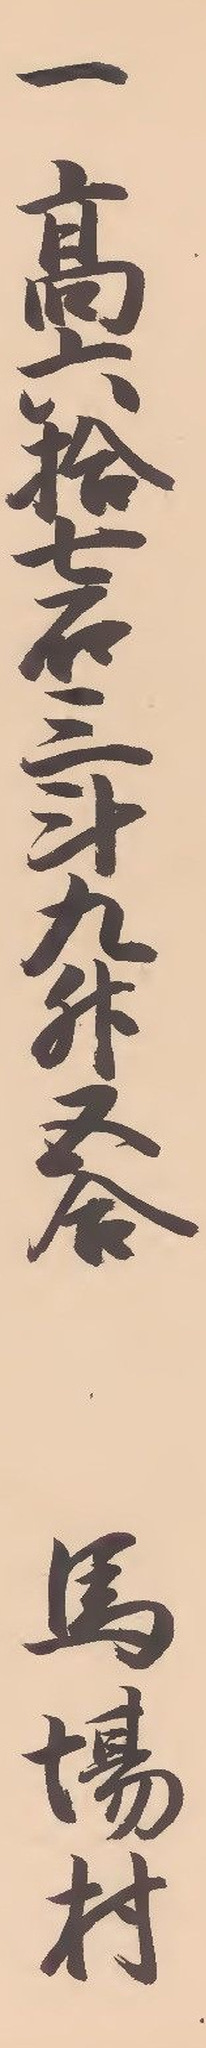一高六拾七石三斗九升五合馬場村
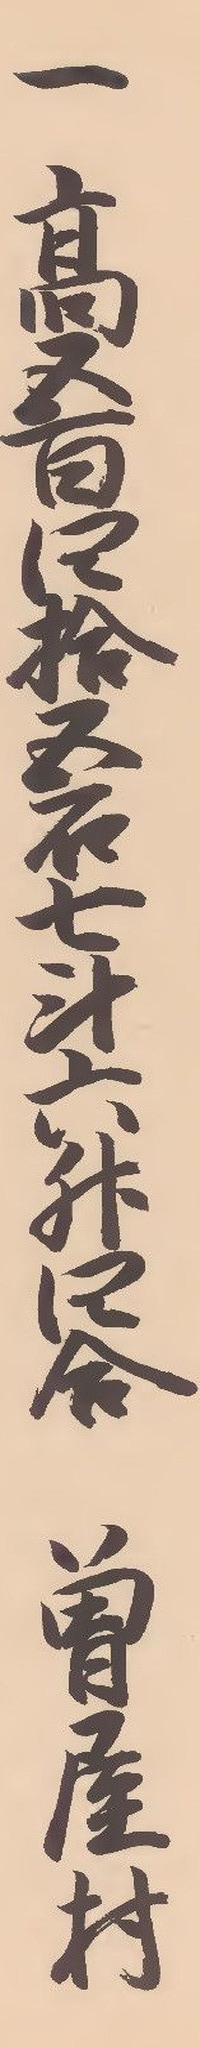一高五百四拾五石七斗六升四合曽屋村
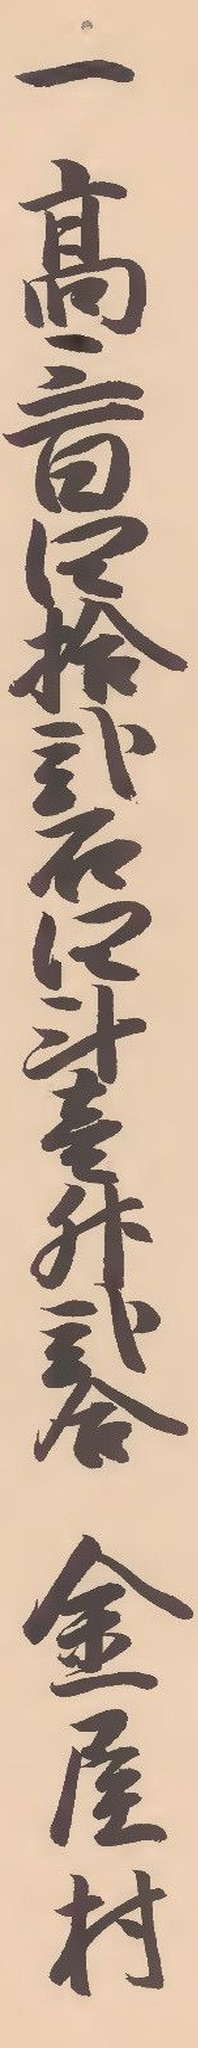一高三百四拾弐石四斗壱升弐合金屋村
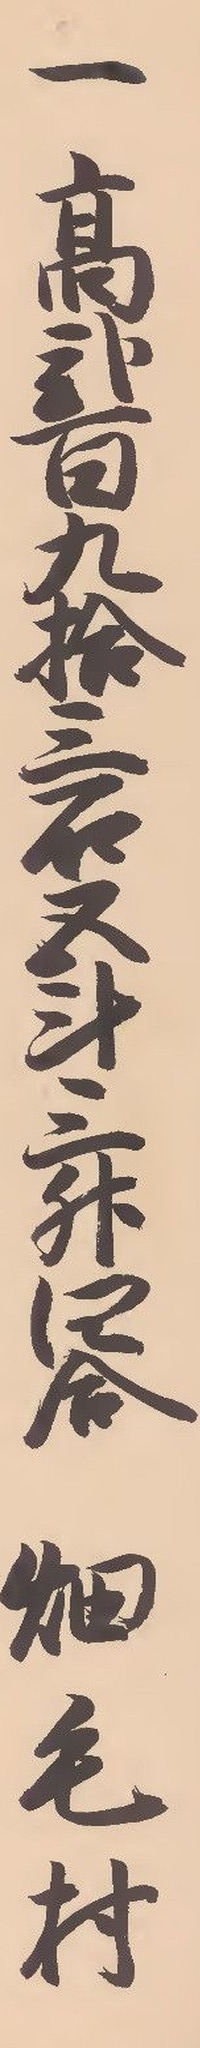一高弐百九拾三石五斗三升四合畑毛村
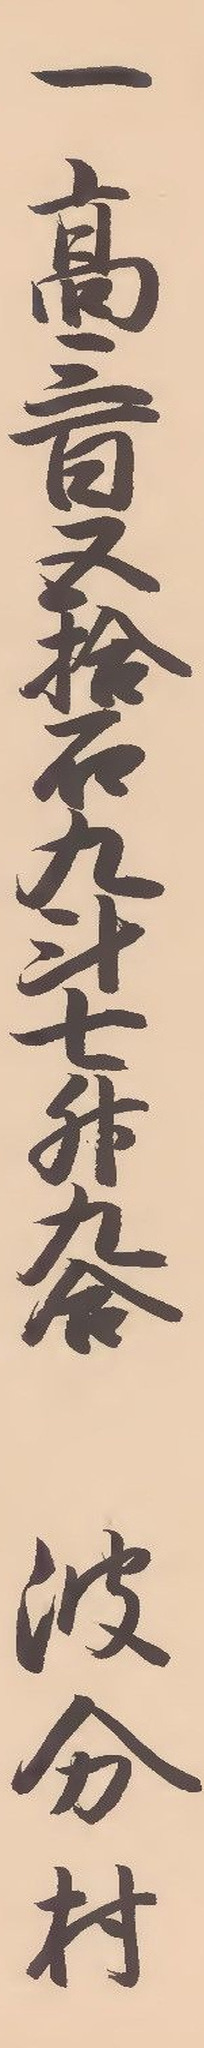一高三百五拾石九斗七升九合波分村
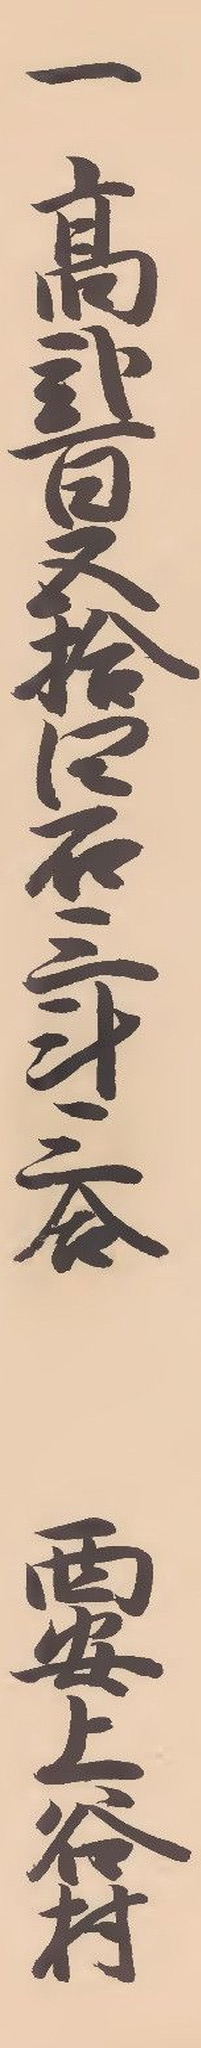一高弐百五拾四石三斗三合西安上谷村
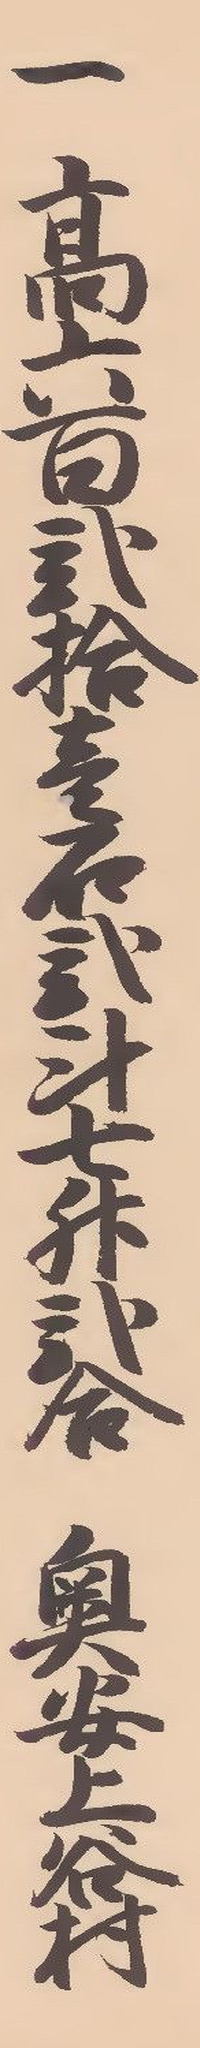一高六百弐拾壱石弐斗七升弐合奥安上谷村
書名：紀伊国郷帳
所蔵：国立公文書館 National Archives of Japan
